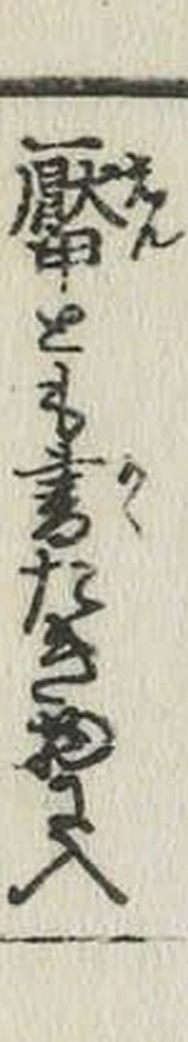厴とも書たき物に入
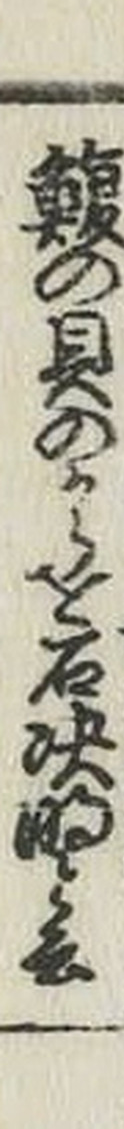鰒の貝のからを石决明と云
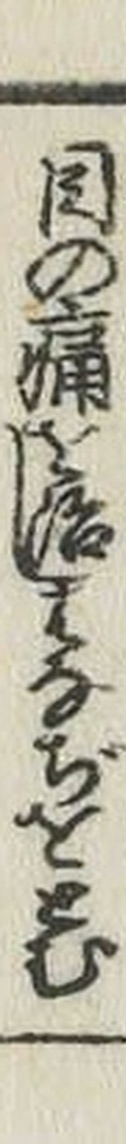目の痛を治しはなぢをとむ
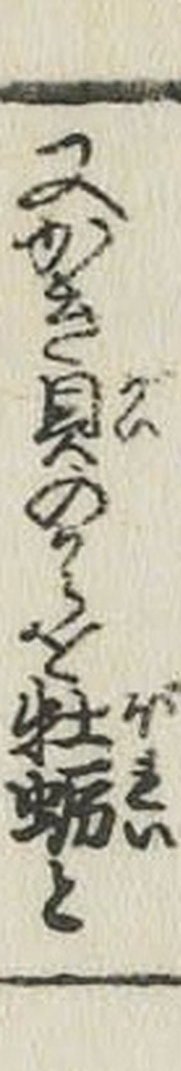又かき貝のからを牡蠣と
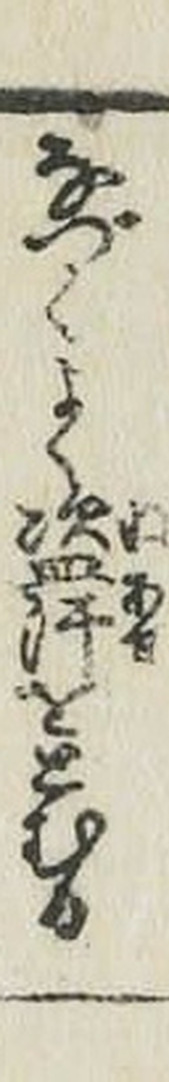なづくよく盜汗をとむる
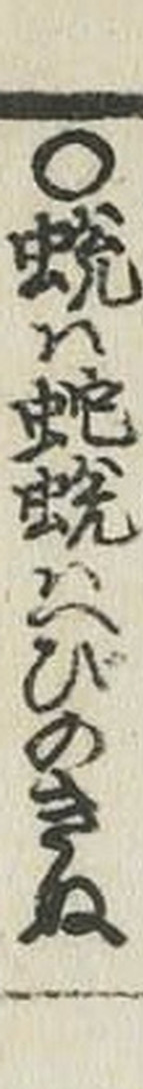○蛻は蛇蛻はへびのきぬ
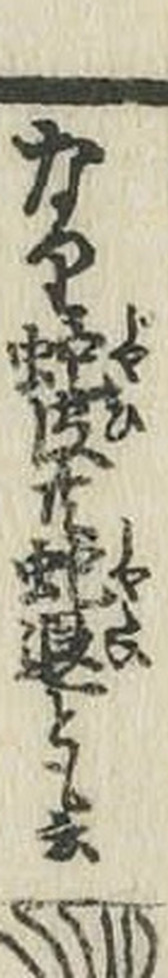なり蛇皮共蛇退とも云
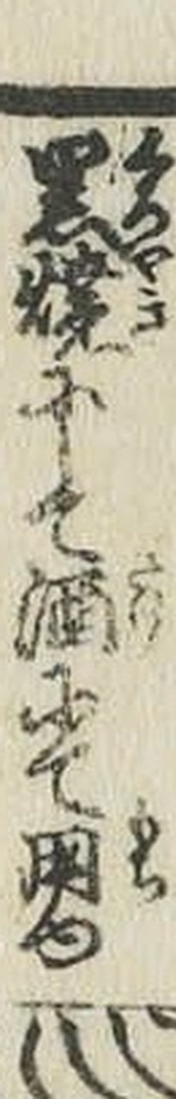黒焼にして酒にて用ゆ
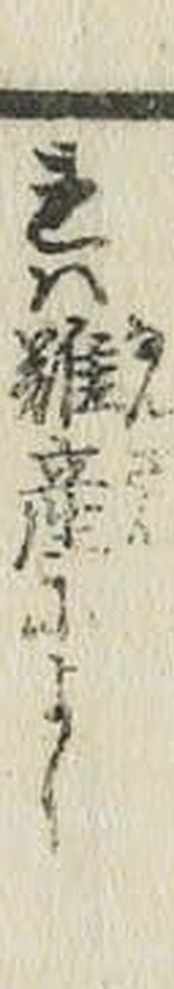れは難産によし
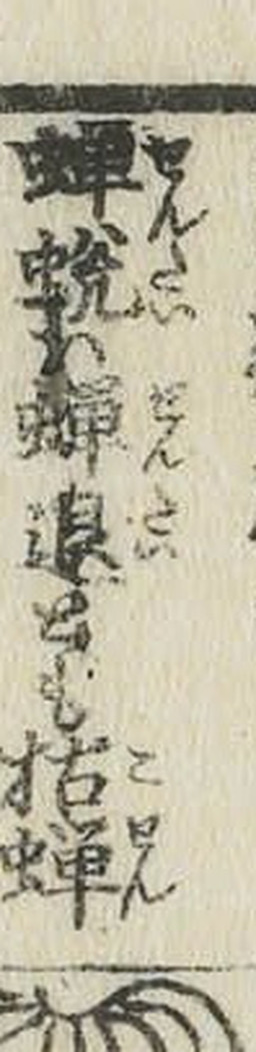蝉蛻は蝉退とも枯蝉
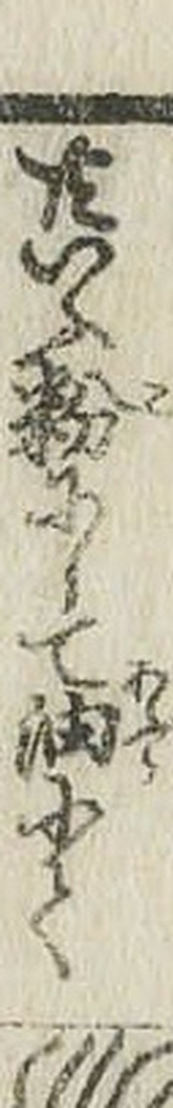共いふ粉にして油にて
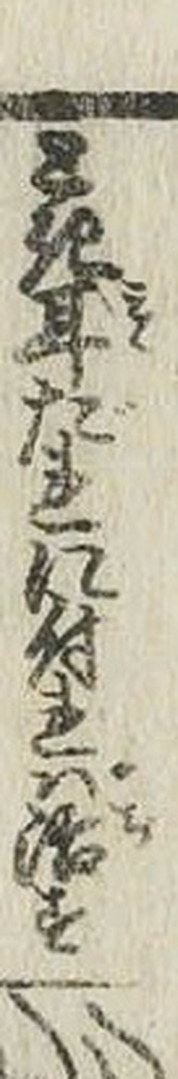とき耳だれに付れば治す
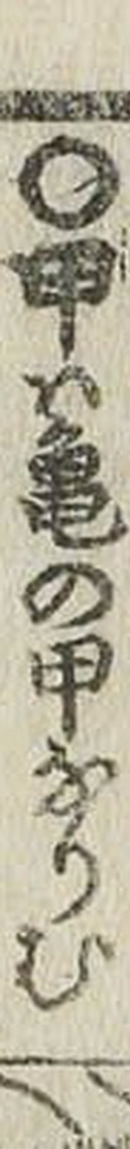○甲は亀の甲なりむ
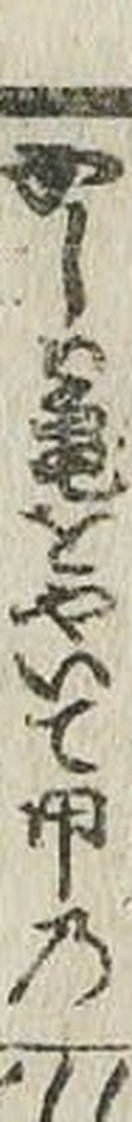かしは亀をやいて甲の
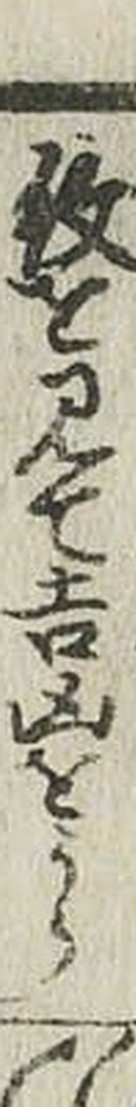紋を見て吉凶をうら
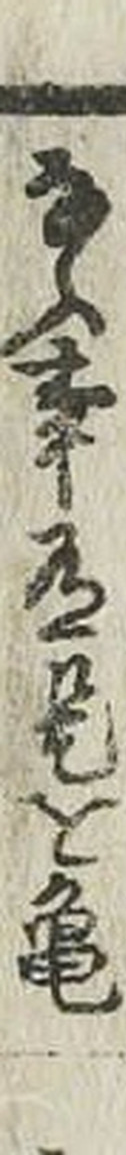なふ事有是を亀
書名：増補頭書訓蒙図彙大成 10巻 7:巻之14-16
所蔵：東京学芸大学教育コンテンツアーカイブ
